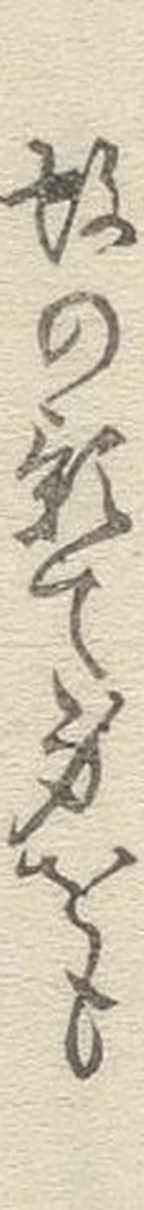蚊の影て身をも
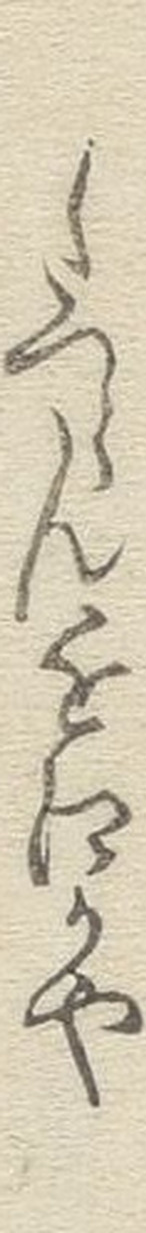たつらん近江かや
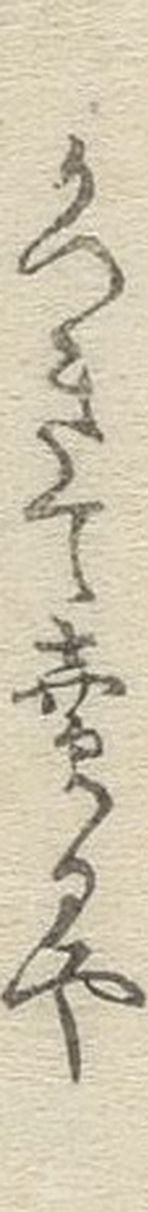かつきて売るや
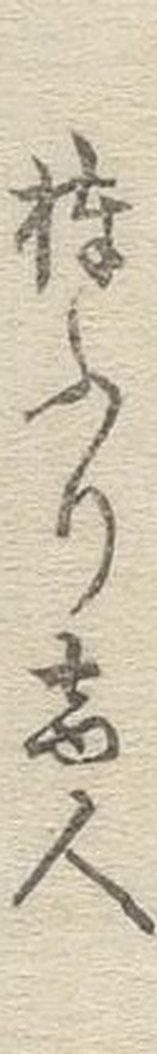棒ふり商人
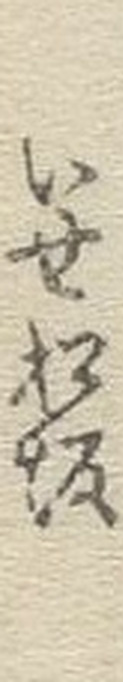いせ松坂
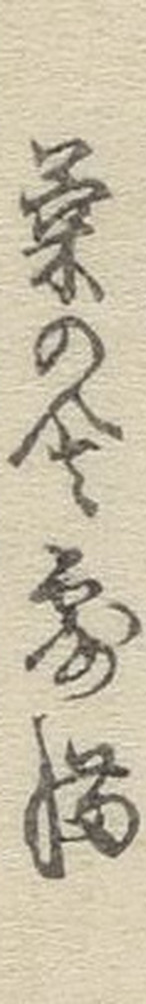桑の舎露満
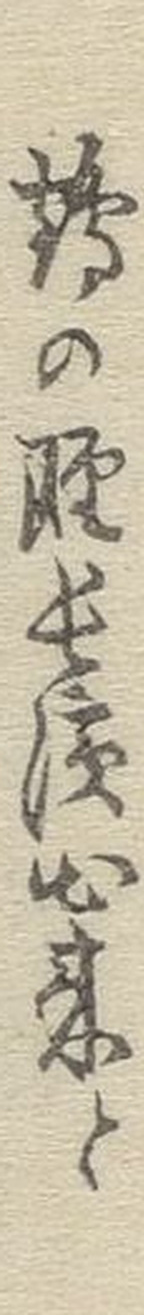鶴の脛長浜出来と
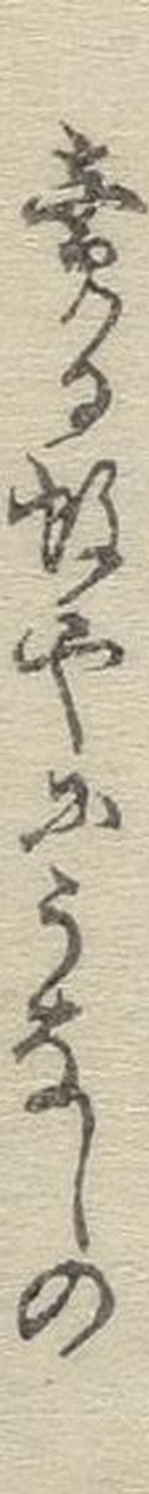売る蚊やにうなしの
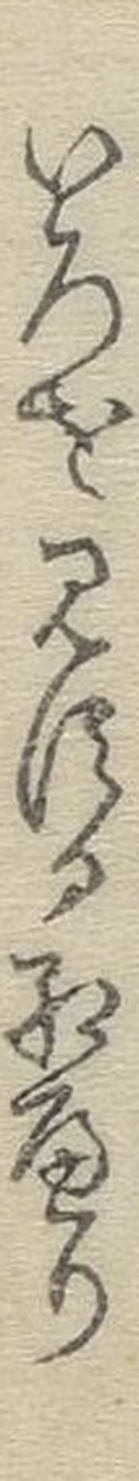いろを見する紅へり
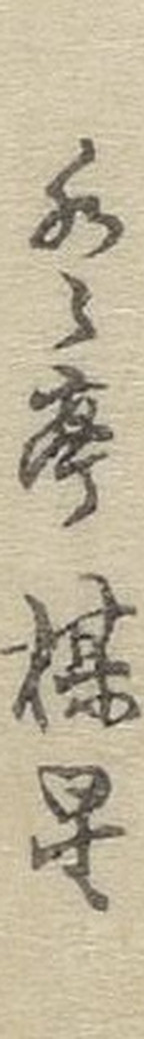水々亭楳星
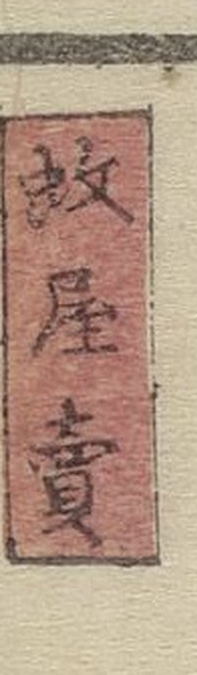蚊屋売

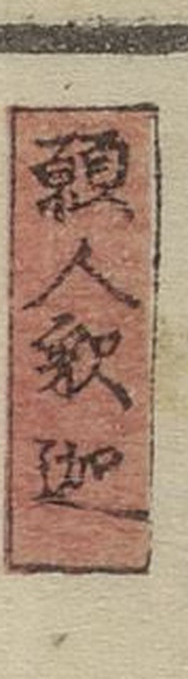願人釈迦
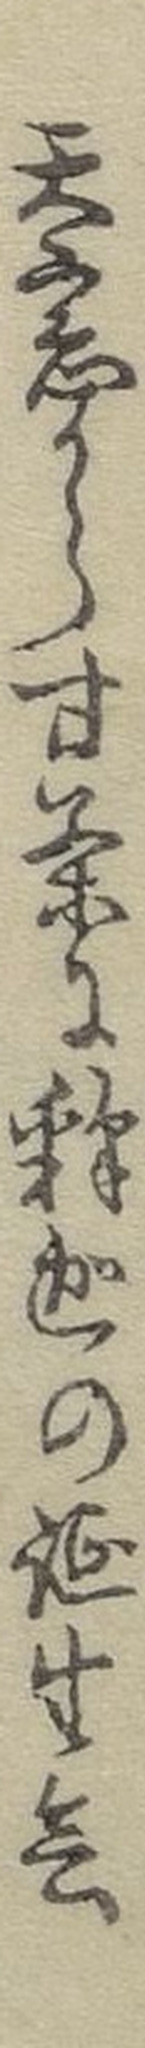天窓から甘茶に釈迦の誕生言
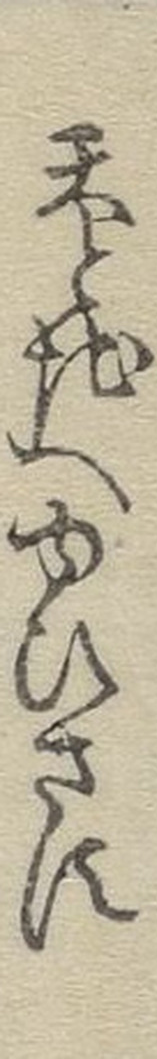天と地へゆひさす
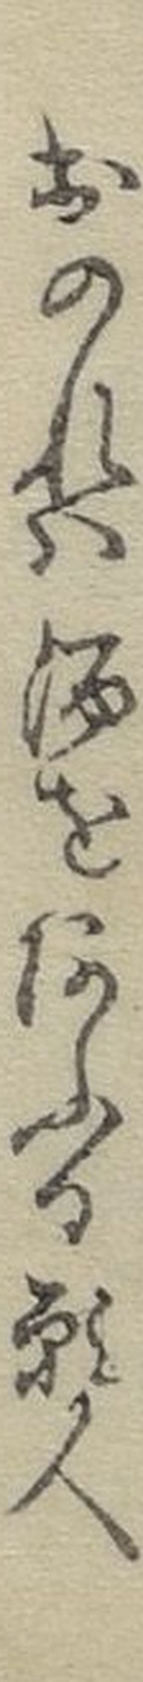おのれは酒をあふる願人
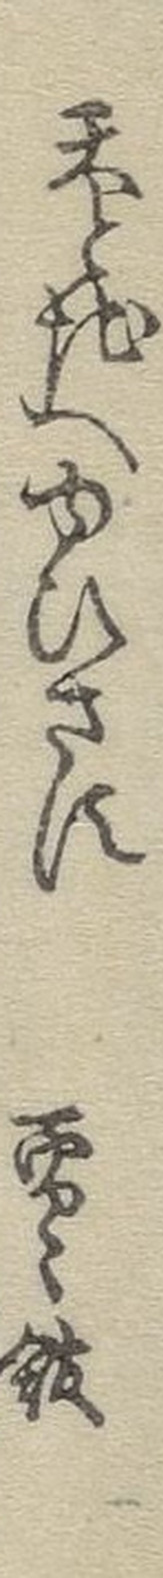天と地へゆひさす勇々館
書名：Picture Album of People with Kyōka (Light Verse) (Kyōka shiki jinbutsu 狂歌四季人物)
